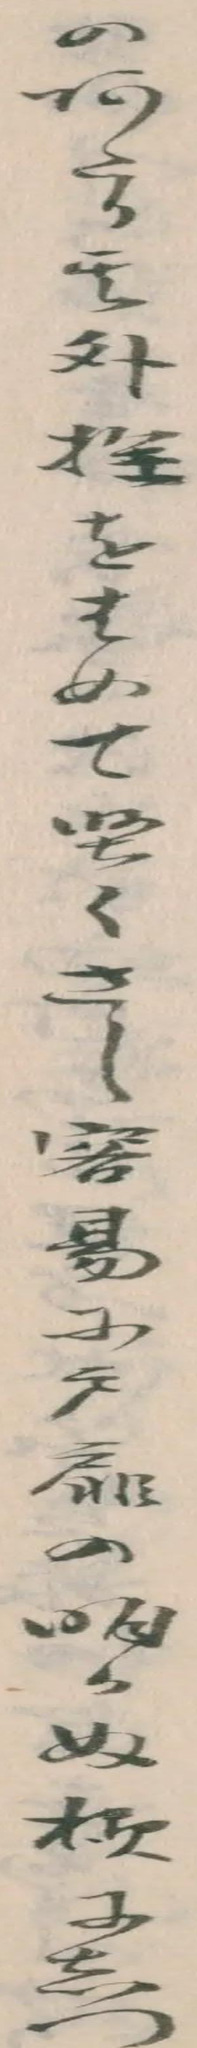のあたり其外栓をはめて堅くさし容易に戸扉の明かぬ様にしつ
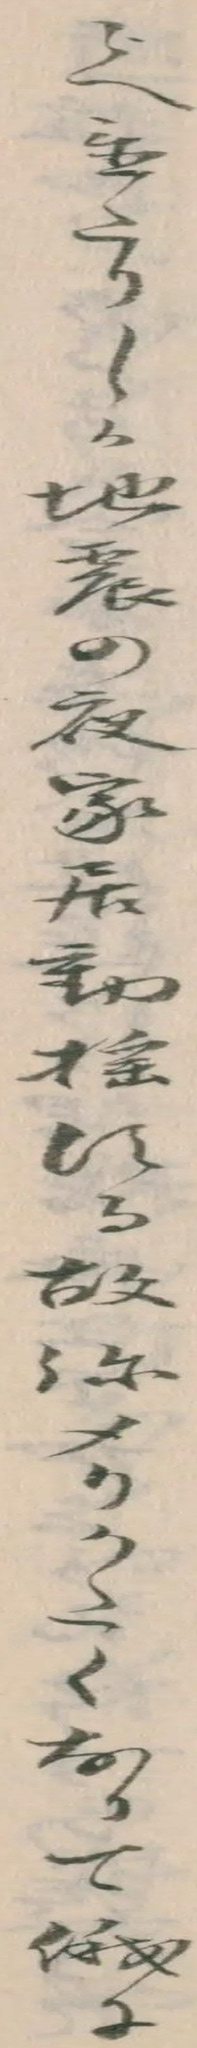らへ置たりしか地震の夜家居動揺する故弥〆りかたくなりて俄に
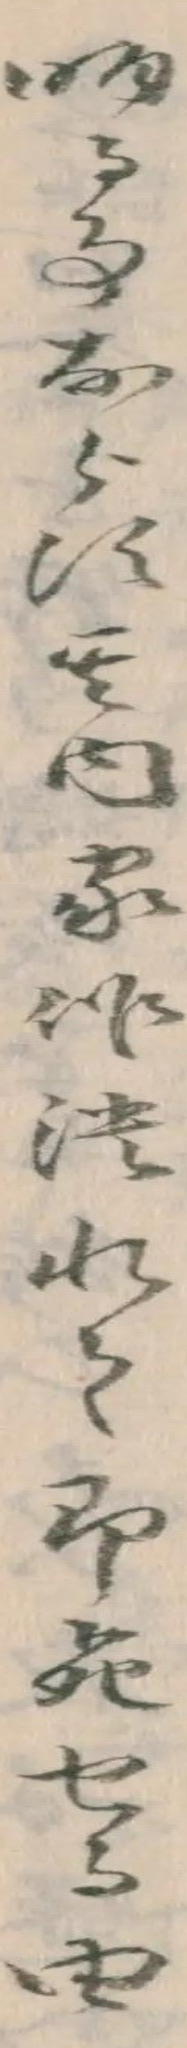明る事ならす其内家作潰れて即死せる由
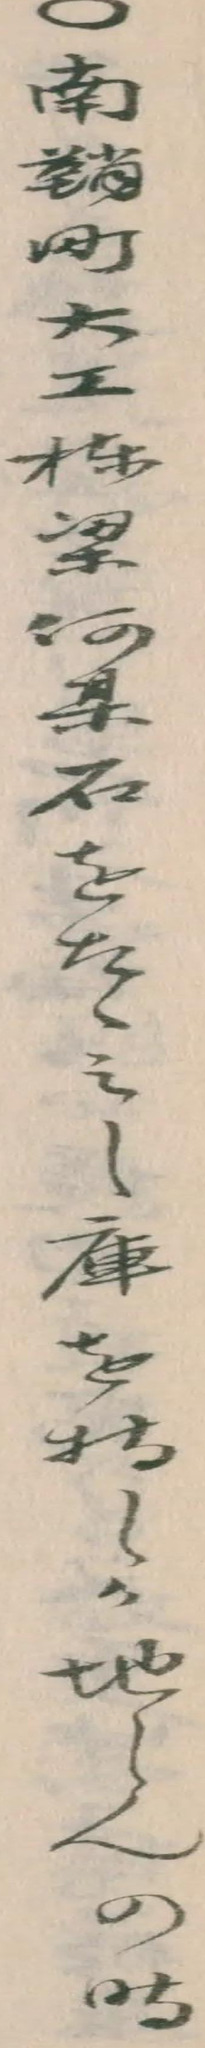〇南鞘町大工棟梁何某石をたゝみし庫を持しか地しんの時
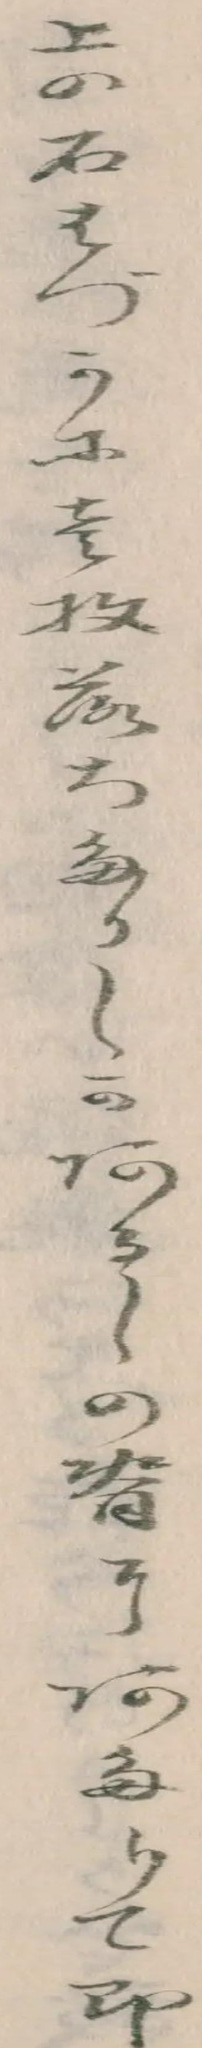上の石はづかに壱枚落ちたりしかあるしの脊にあたりて即
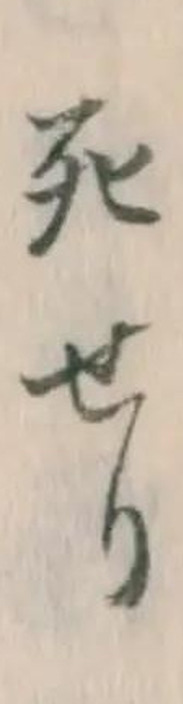死せり
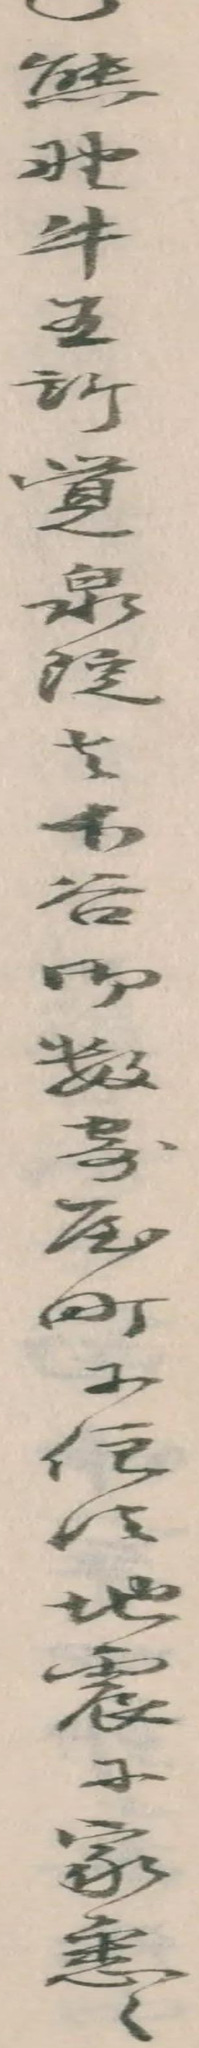〇熊野牛王所覚泉院は下谷御数寄屋町に住す地震に家悉く
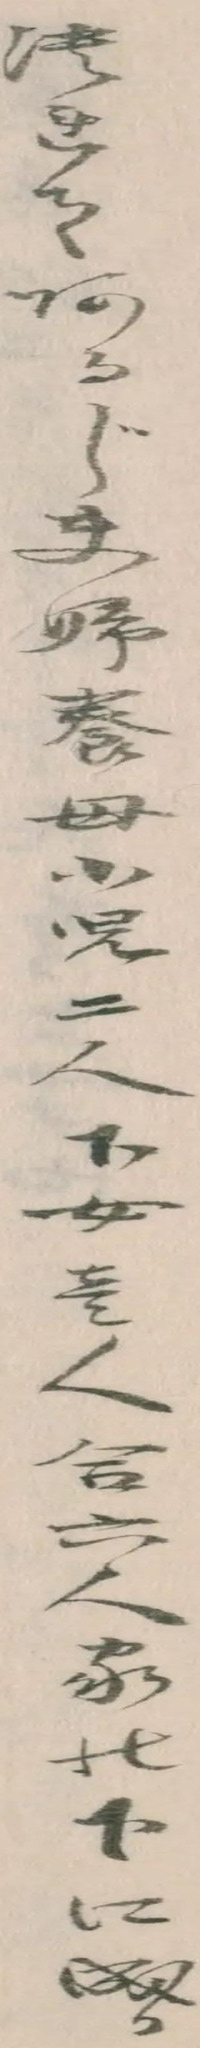潰れてあるじ夫婦養母小児二人下女壱人合六人家の下に成り
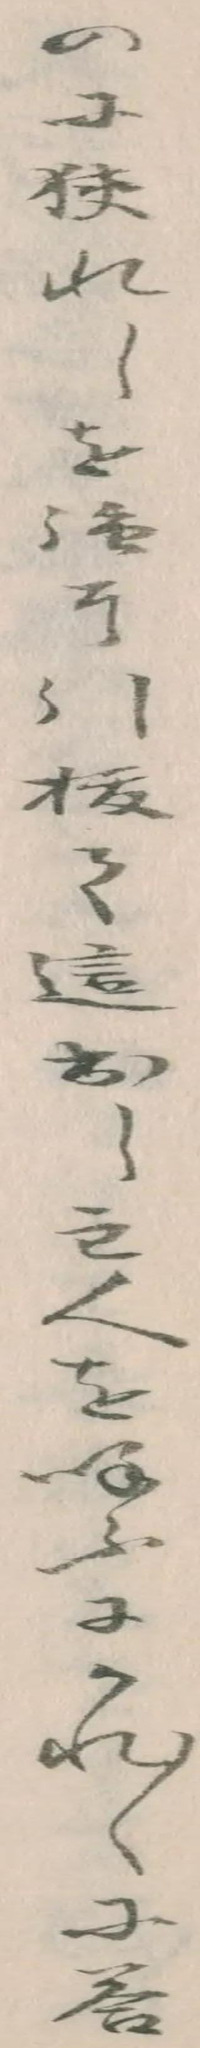のに挟れしを強に引抜て這出し主人を呼ふにかれ〳〵に答
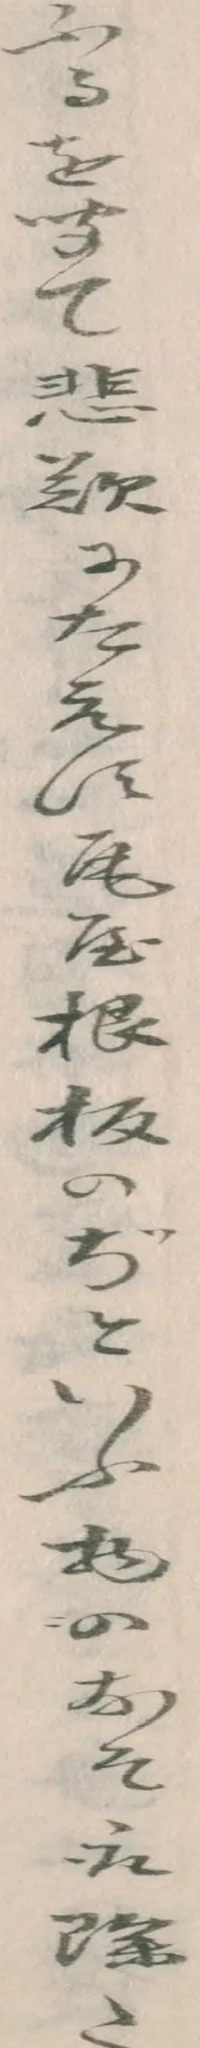ふるを聞て悲歎にたえす瓦屋根のぢといふ物のおそ取除た
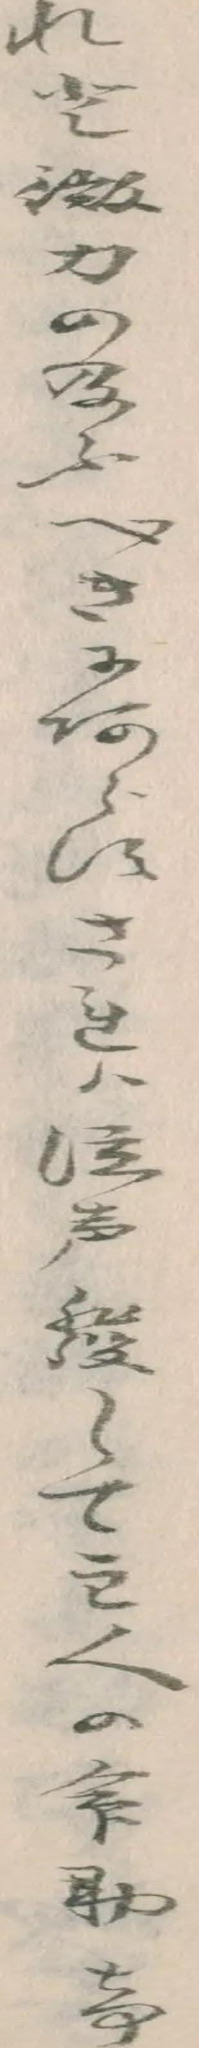れと微力の及ふべきにあらすされは泣声発して主人の命助け
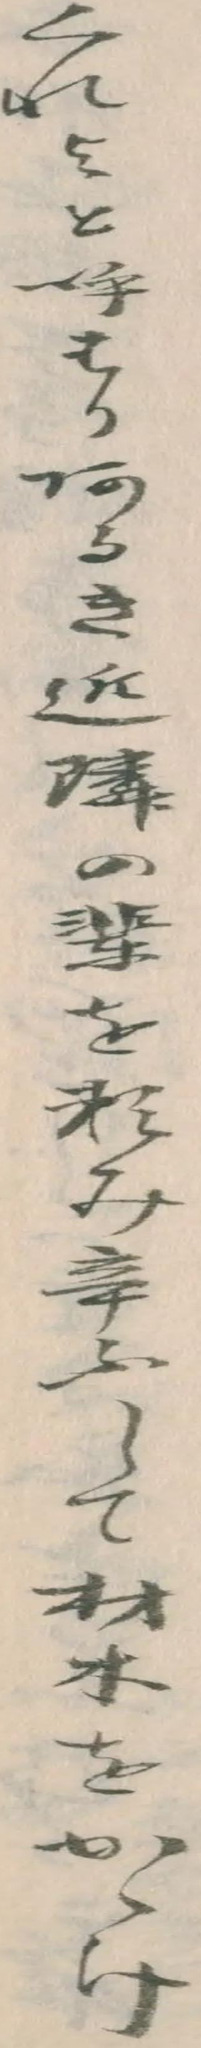くれよと呼はりあるき近隣の輩を頼み辛ふして材木をかゝけ

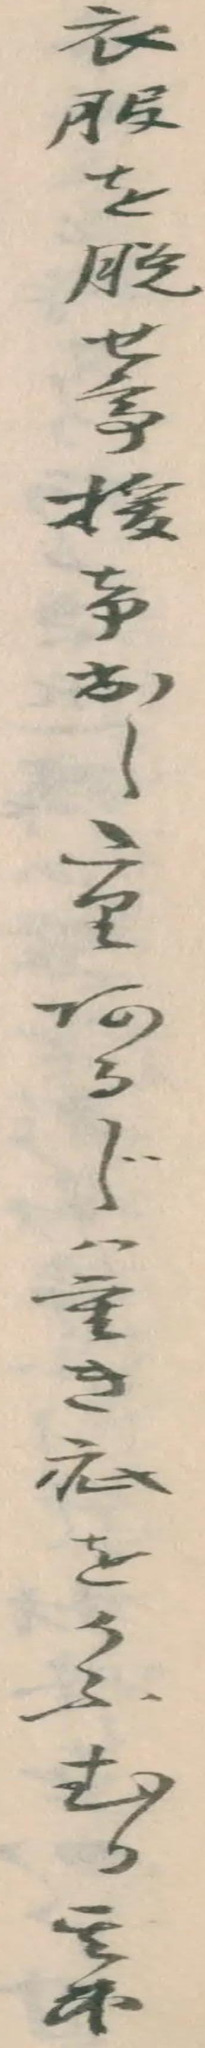衣服を脱せて援け出したりあるじは重き疵をかふむり其外
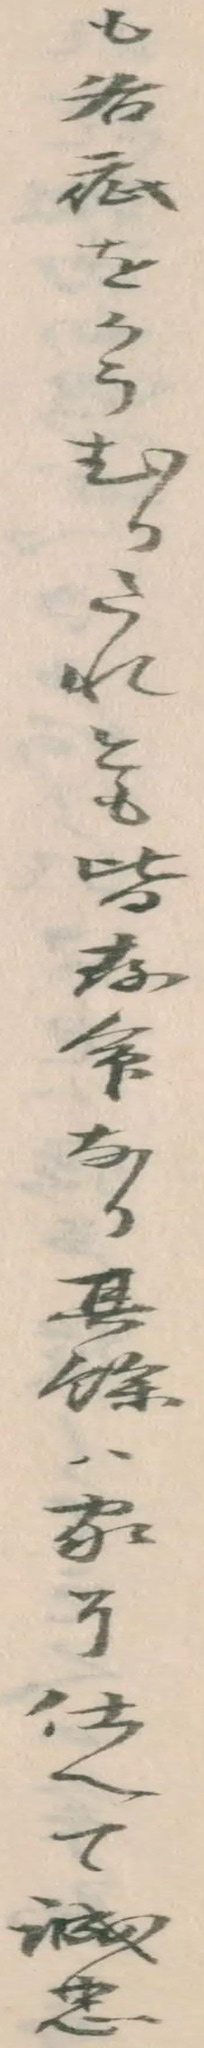も各疵をかうむりたれとも皆存命なり其餘は家に仕へて誠忠
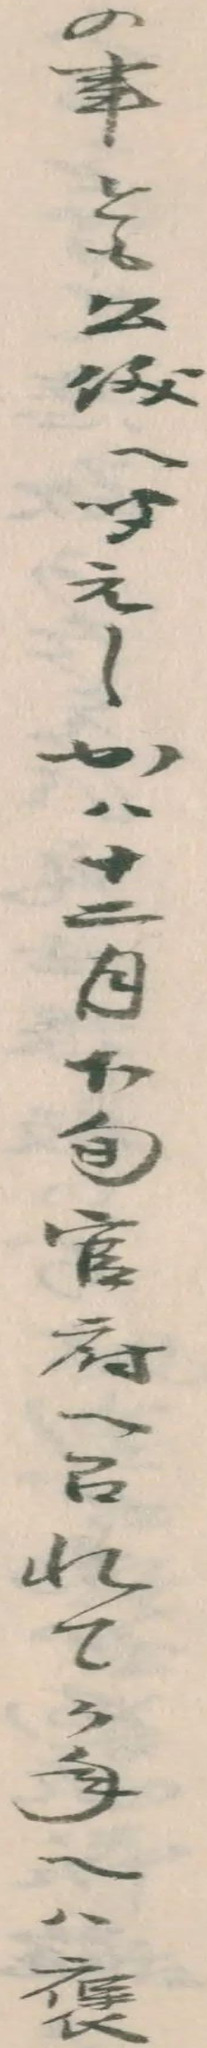の事とも公儀へ聞えしかは十二月下旬官府へ召れてかねへは褒
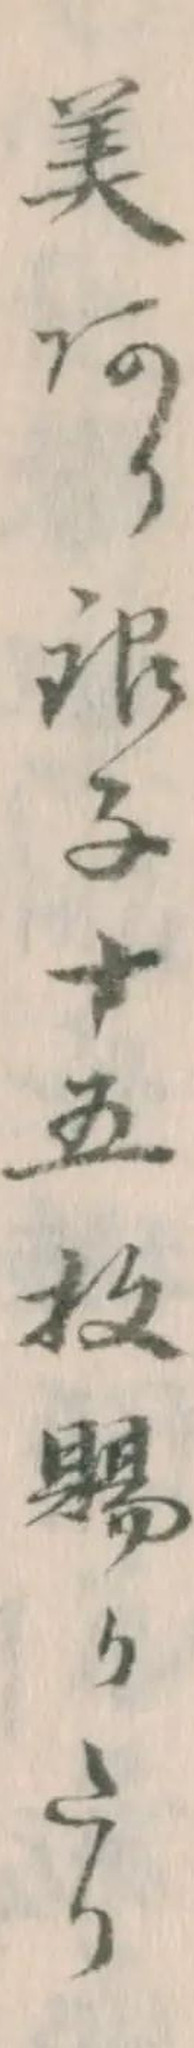美あり銀子十五枚賜りたり
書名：地災撮要. 巻7-9(地震之部)
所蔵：国立国会図書館 National Diet Library, JAPAN
